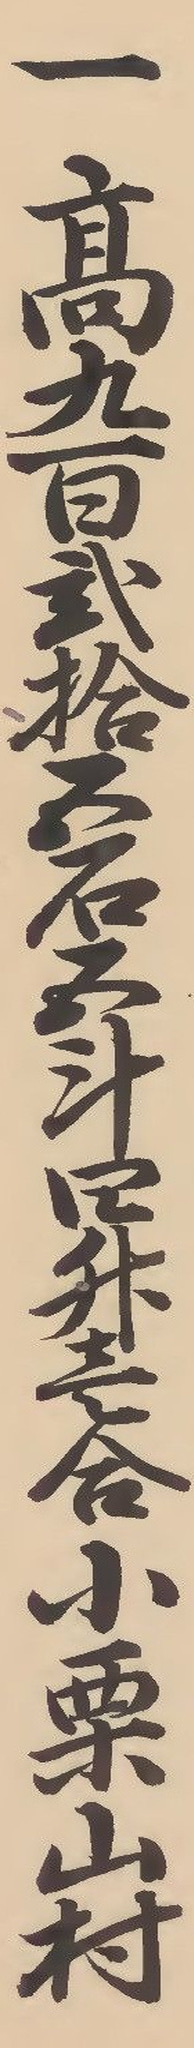一高九百九弐拾五石五斗四升壱合小栗山村

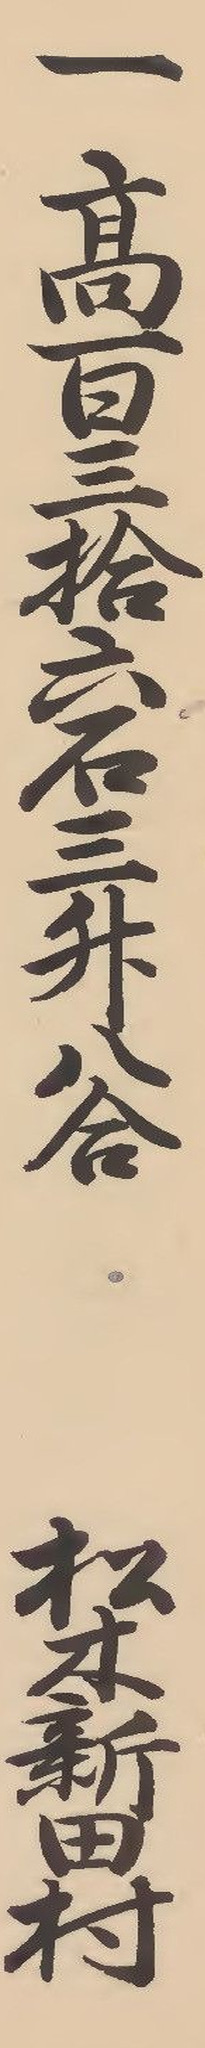一高百三拾六石三升八合松木新田村
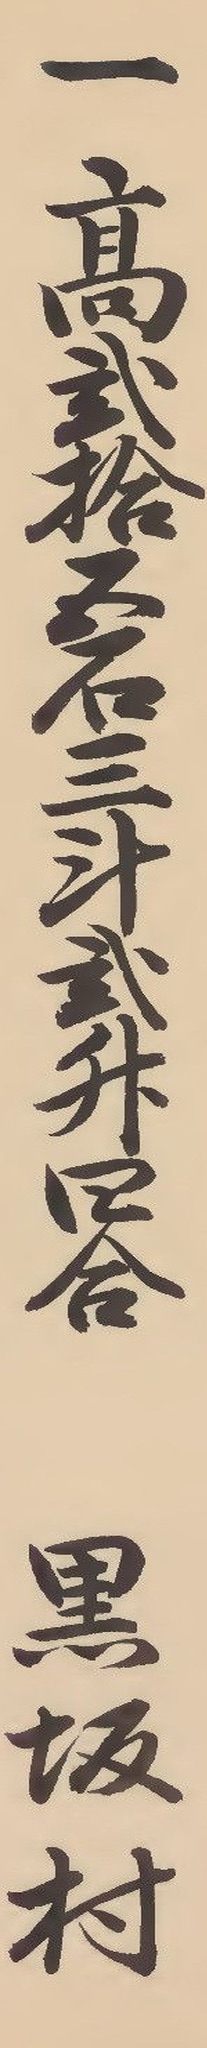一高弐拾五石三斗弐升四合黒坂村
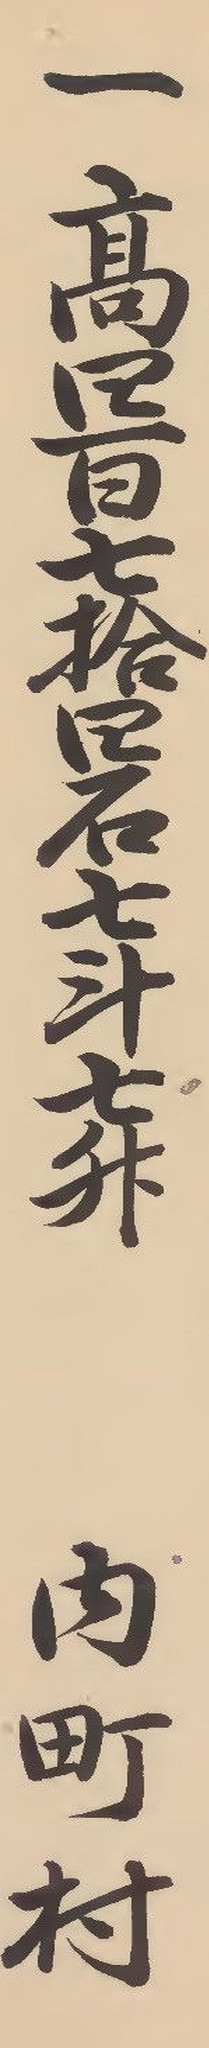一高四百七拾四石七斗七升内町村
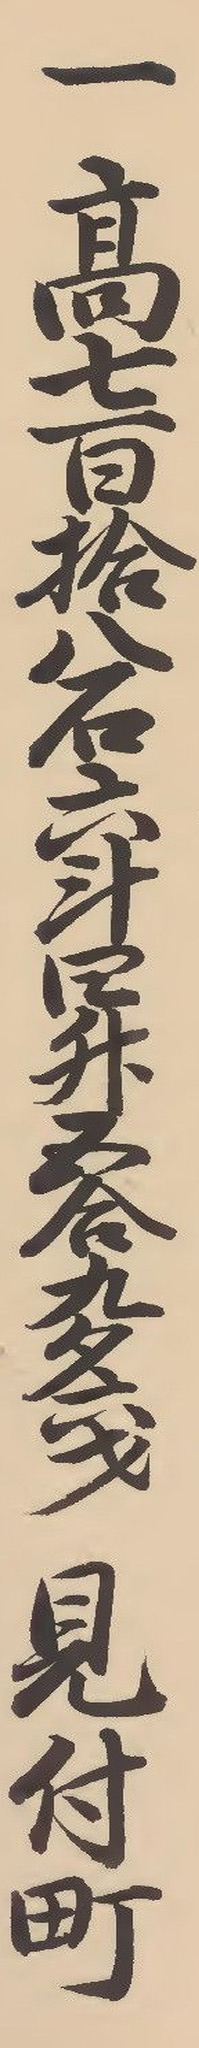一高七百拾八石六斗四升五合九勺六才見付町
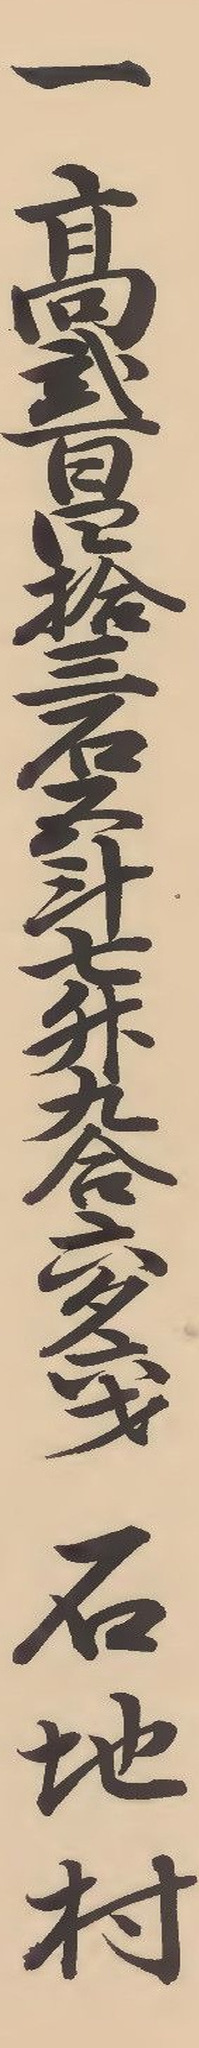一高弐百四拾三石五斗七升九合六勺六才石地村
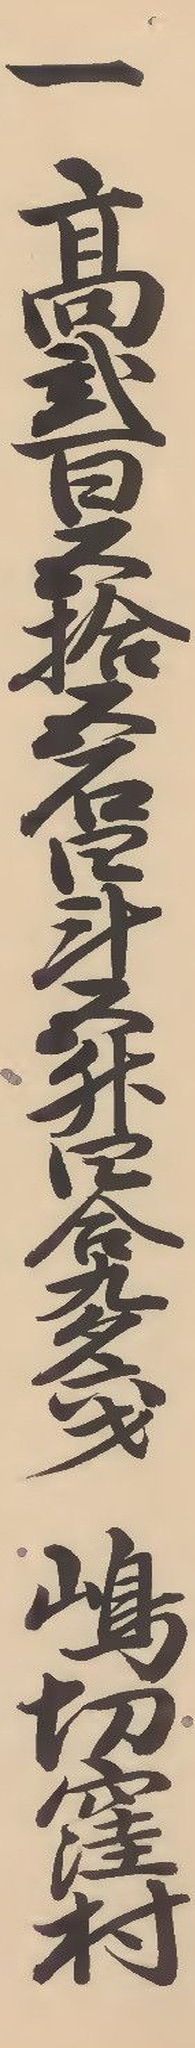一高弐百五拾五石四斗五升四合九勺六才島切窪村
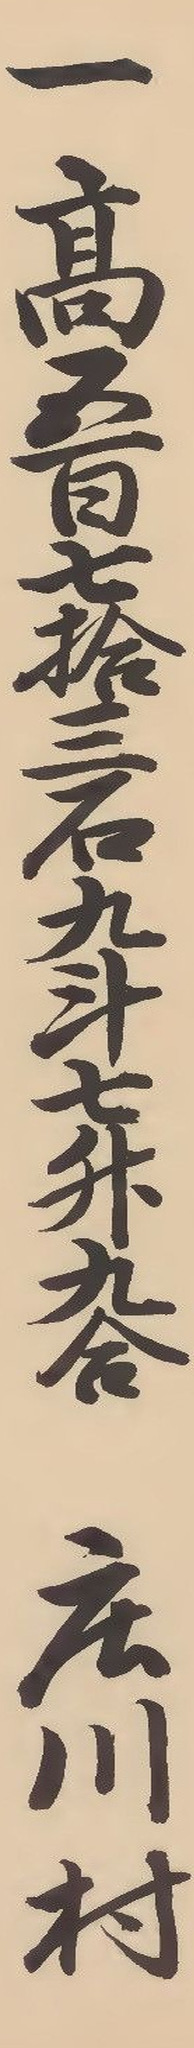一高五百七拾三石九斗七升九合庄川村
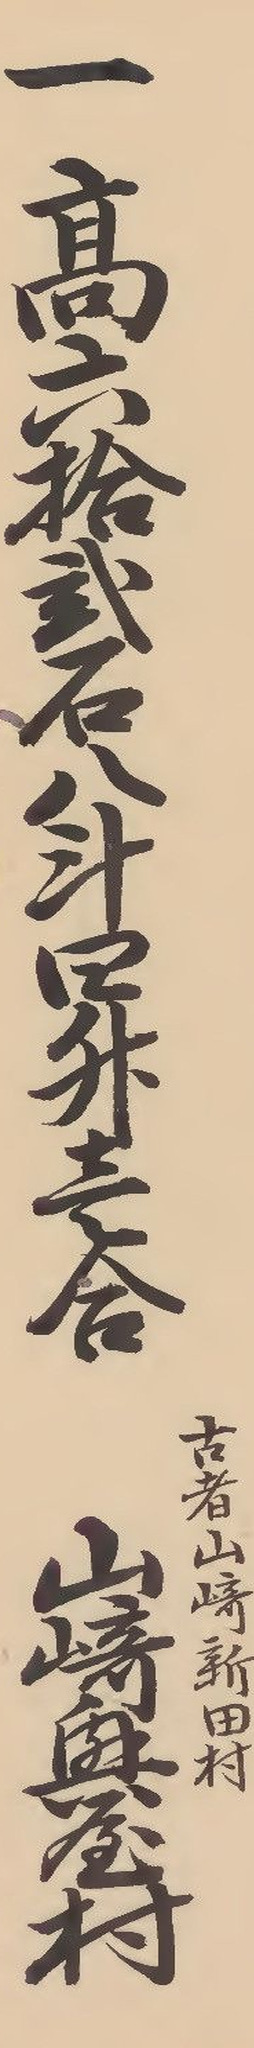一高六拾弐石八斗四升壱合山崎興屋村

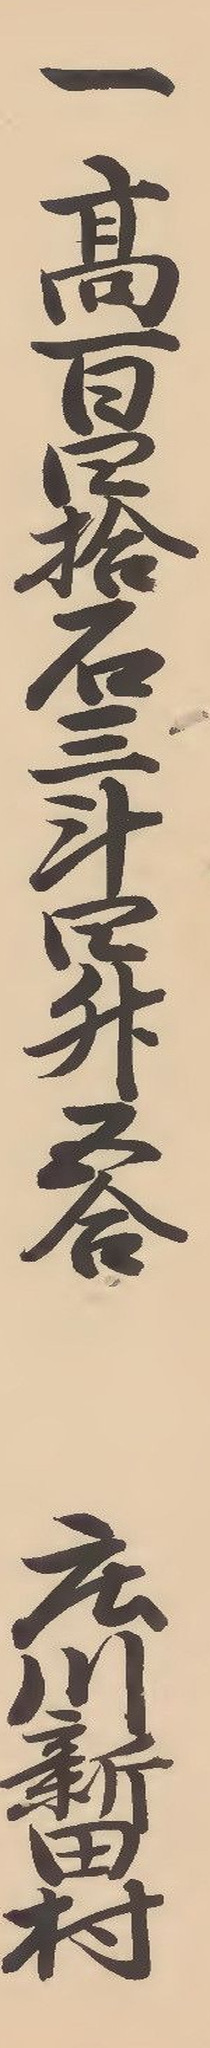一高百四拾石三斗四升五合庄川新田村
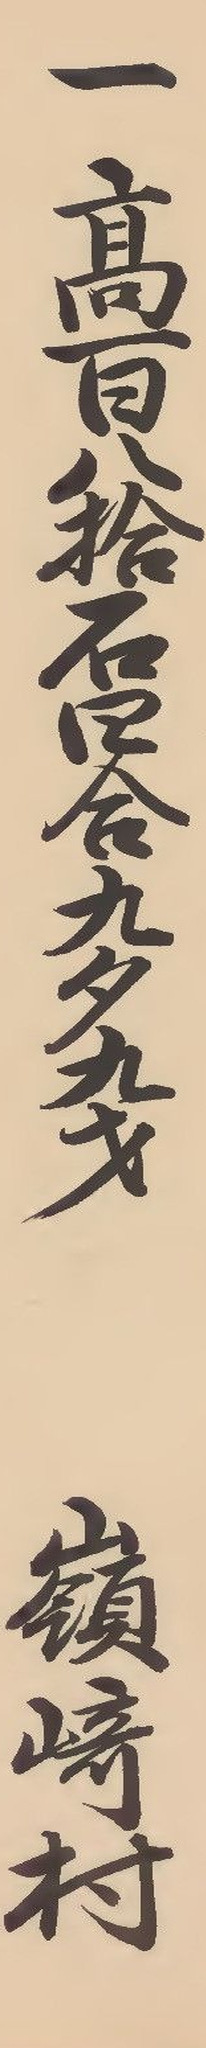一高百八拾石四合九勺九才嶺崎村
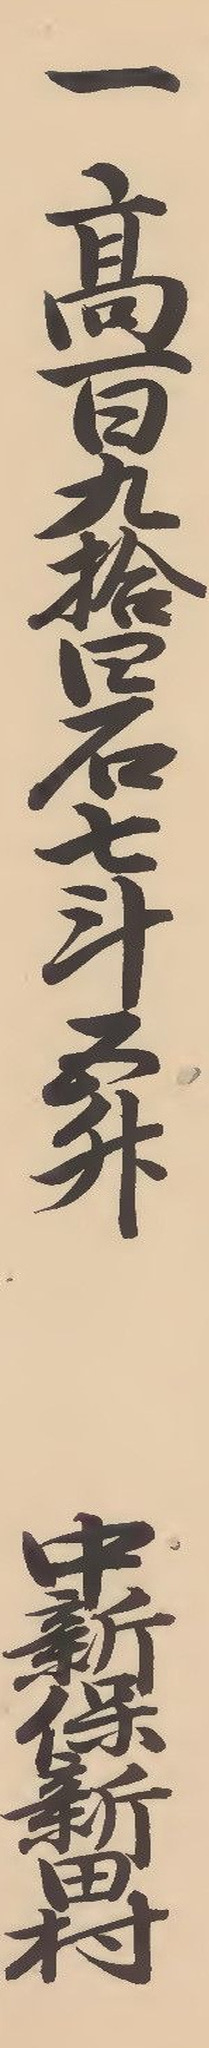一高百九拾四石七斗五升中新保新田村
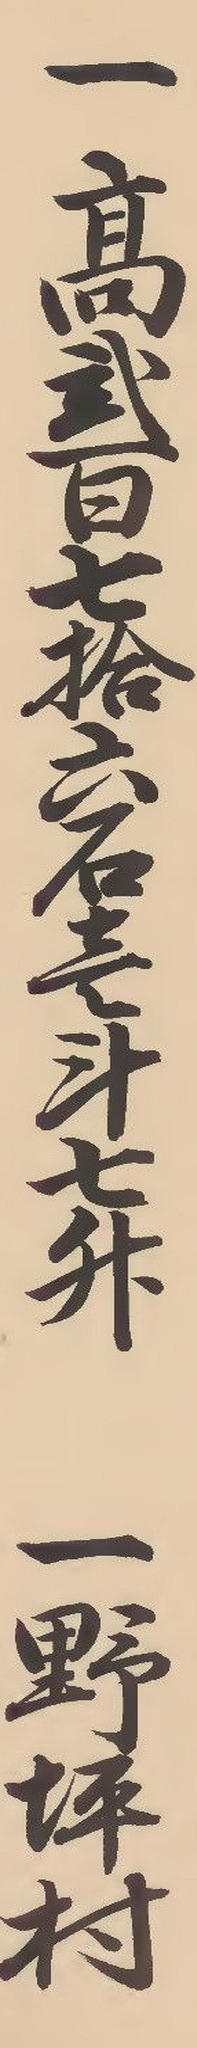一高弐百七拾六石壱斗七升一野坪村
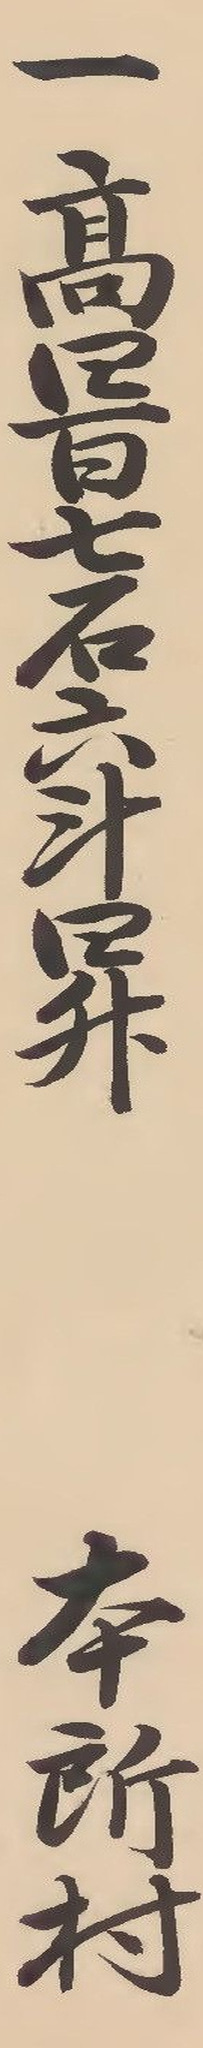一高四百七石六斗四升本所村
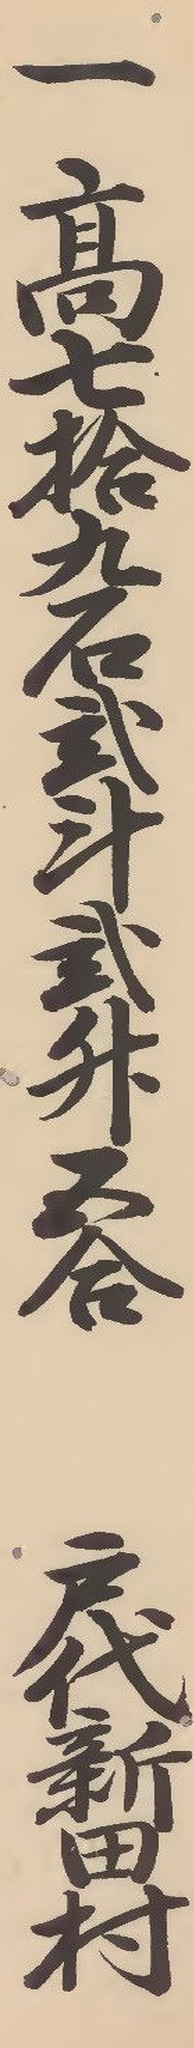一高七拾九石弐斗弐升五合戸代新田村
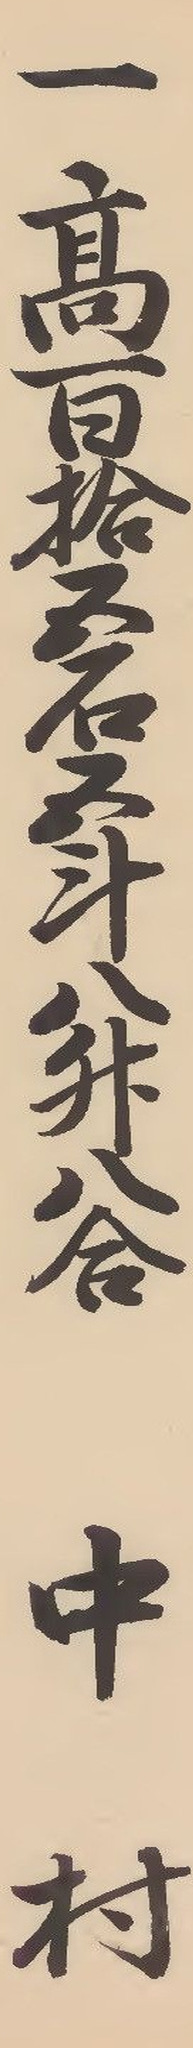一高百拾五石五斗八升八合中村
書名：越後国郷帳　下
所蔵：国立公文書館 National Archives of Japan
